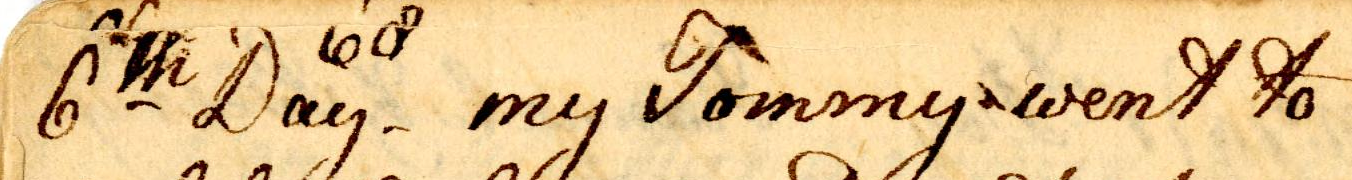6^th Day- my Tommy went to
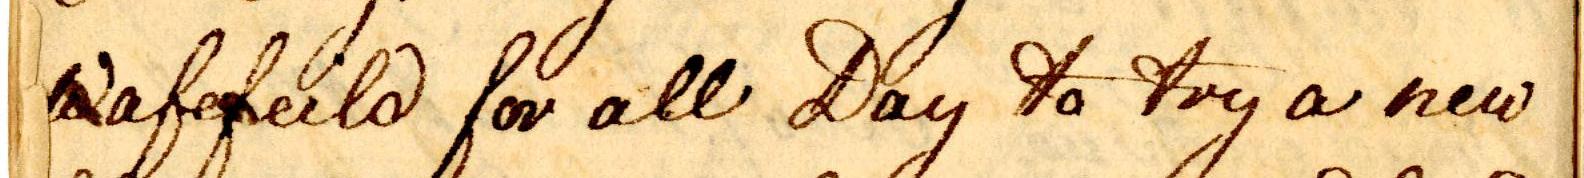Wafefeild for all Day to try a new
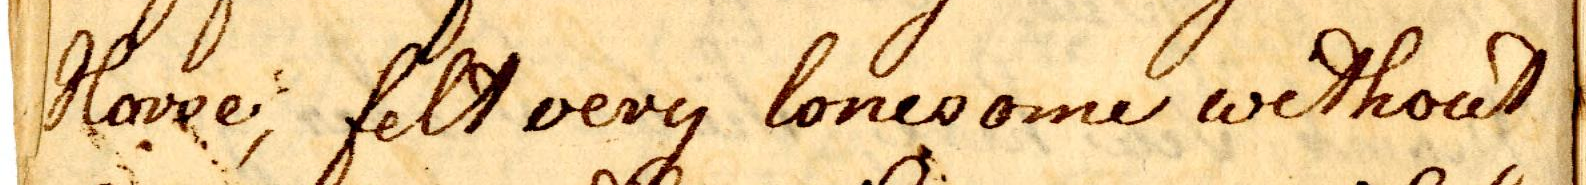Horse, felt very lonesome without
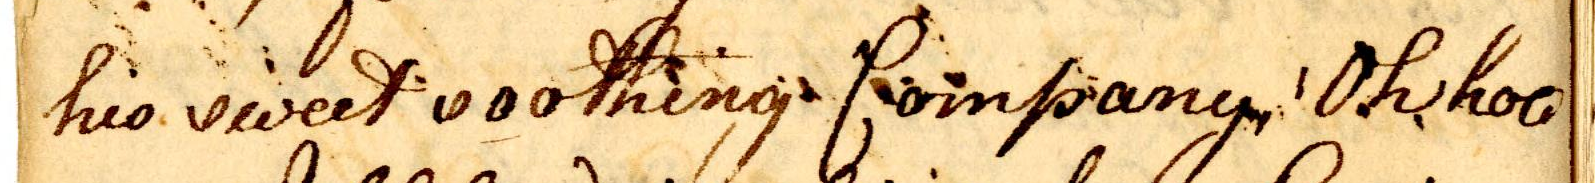his sweet soothing Company, Oh how
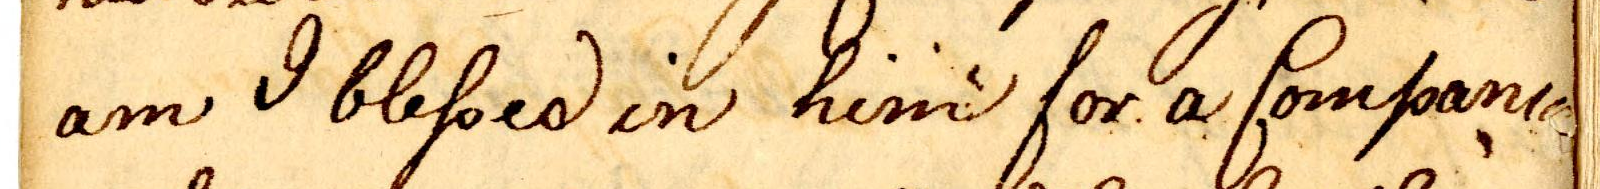am I blessed in him for a Company
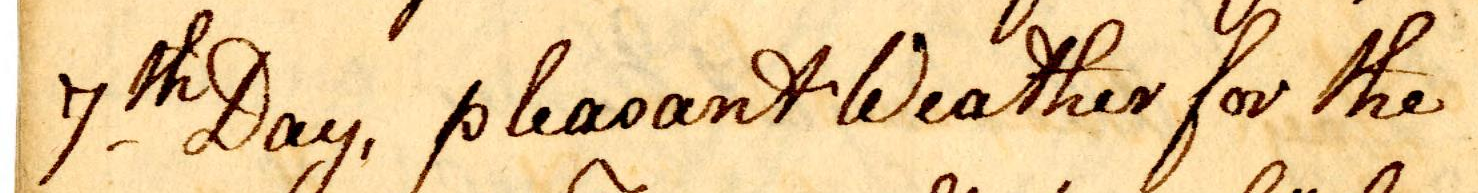7^th Day, pleasant Weather for the
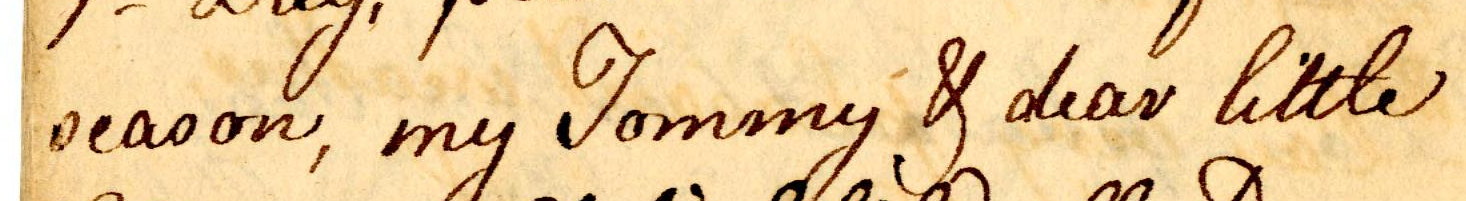season, my Tommy & dear little
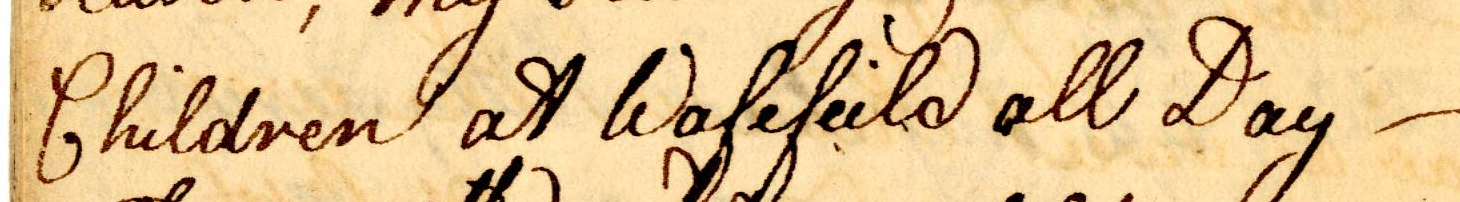Children at Wafefeild all Day
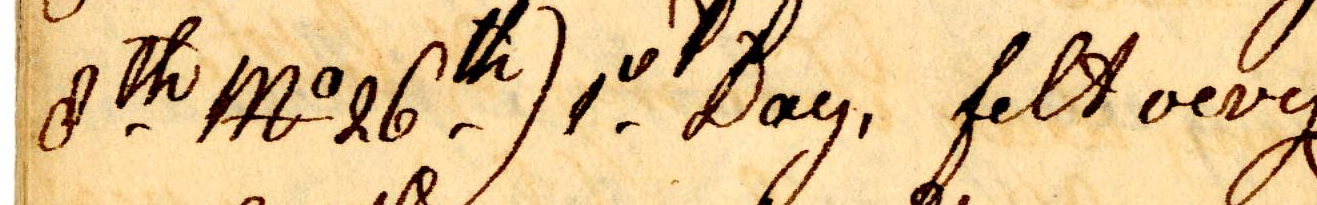8^th M^o 26^th) 1^st Day, felt very
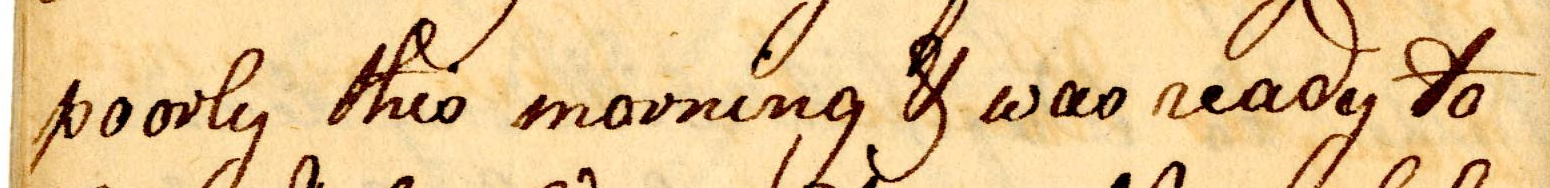poorly this morning & was ready to
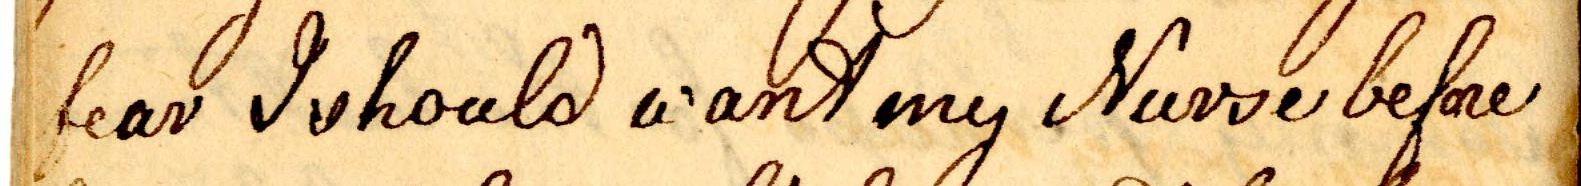fear I should want my Nurse before
